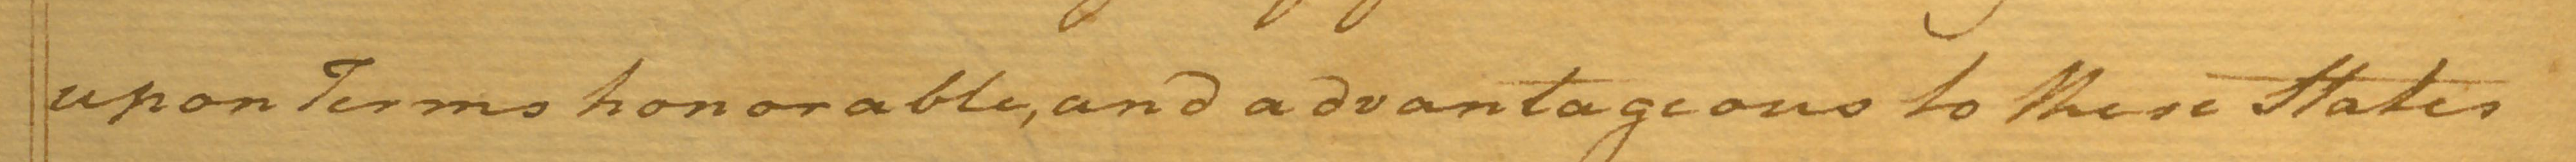upon Terms honourable, and advantageous to these states
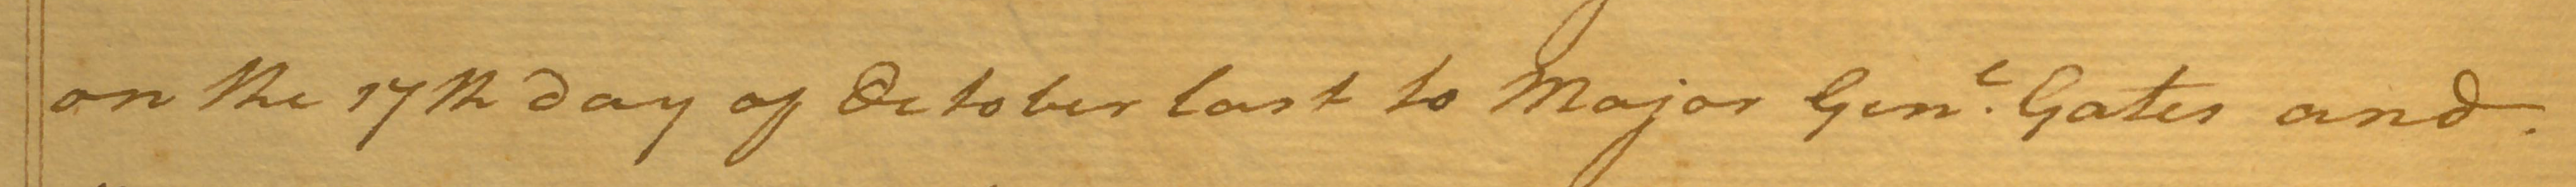on the 17th day of October lost to Major Gen^l. Gates and
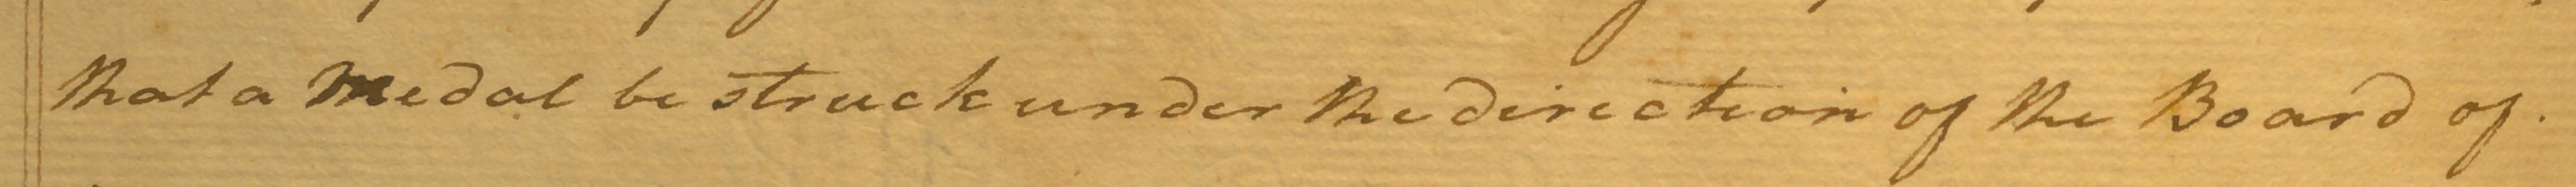that a Medal be struck under the direction of the Board of
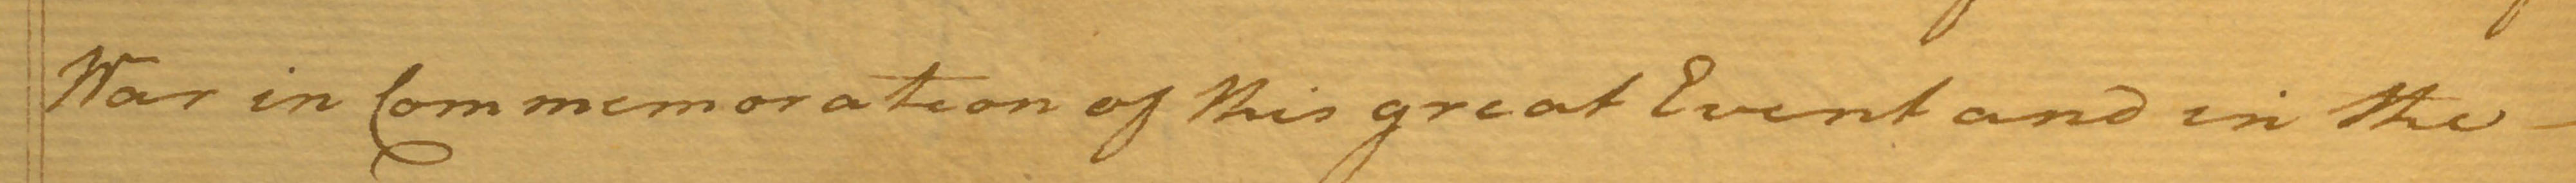War in Commemoration of this great Event and in the
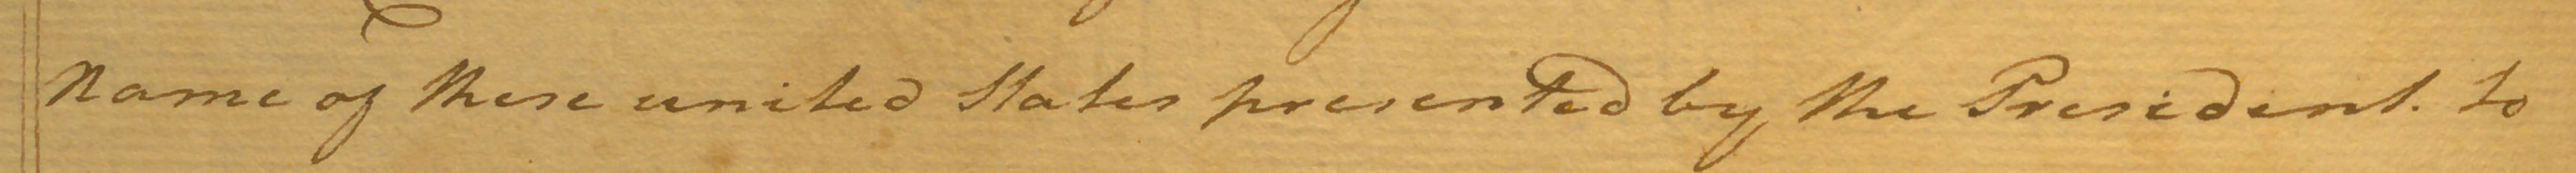Name of these united states presented by the President to
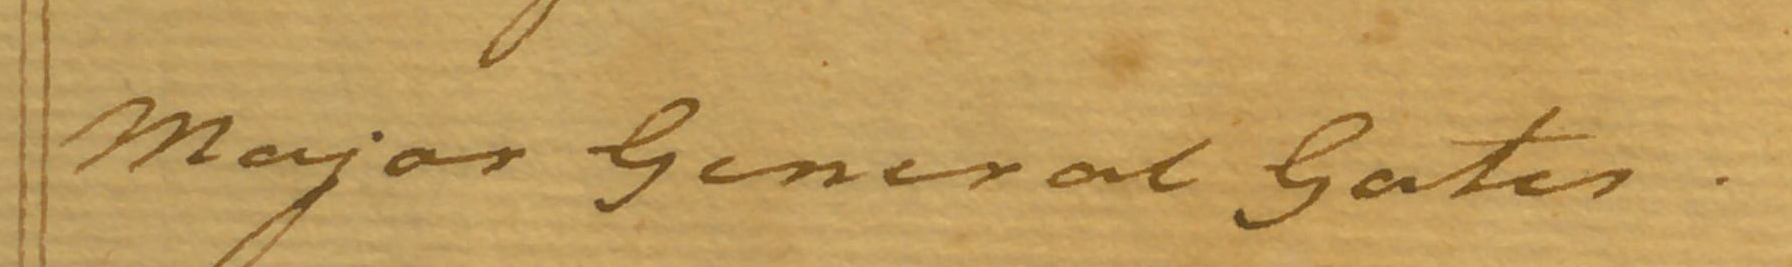Major General Gates.
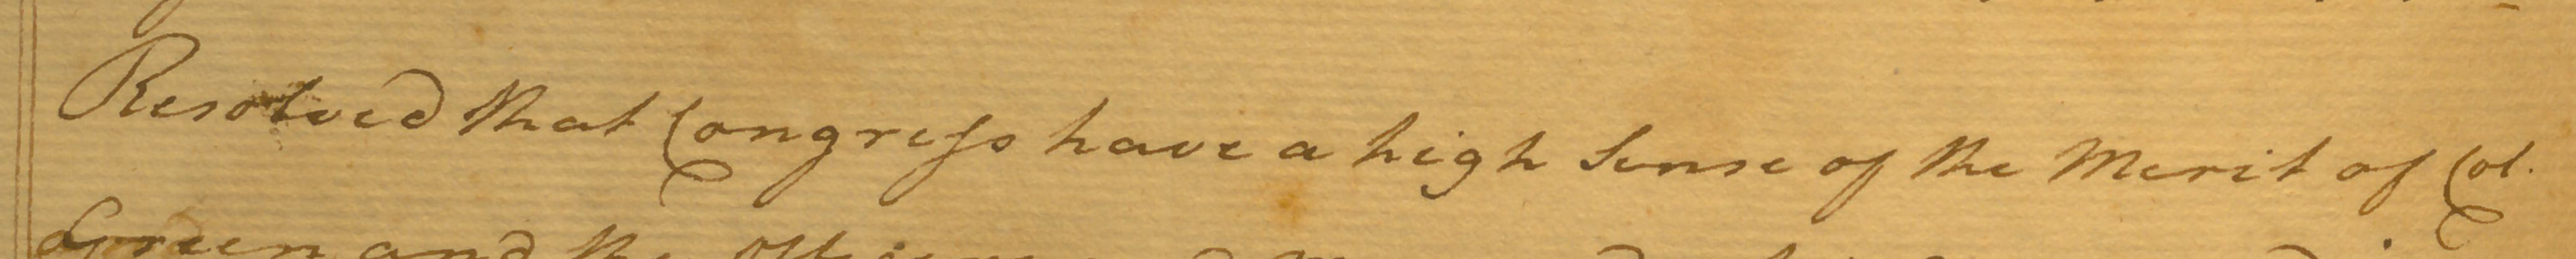Resolved that Congress have a high sense of the Merit of Col.
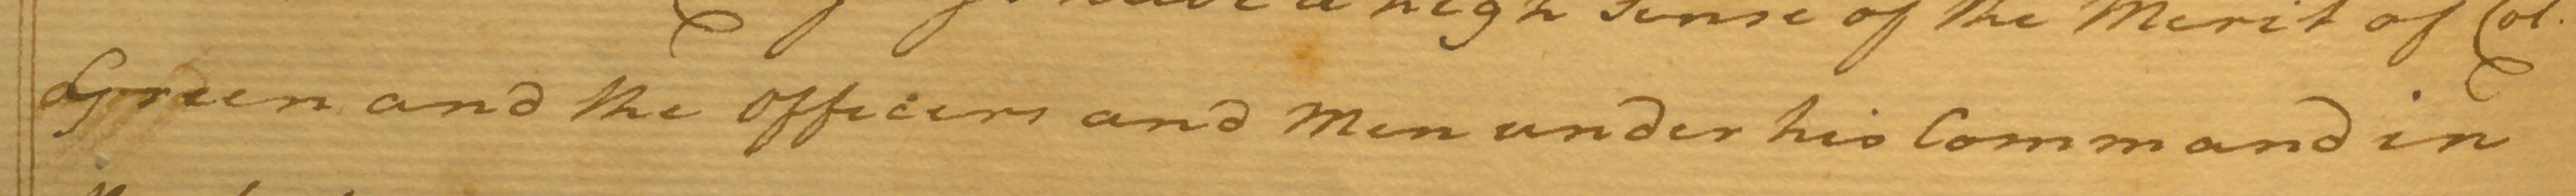Green and the Officers and men under his Command in
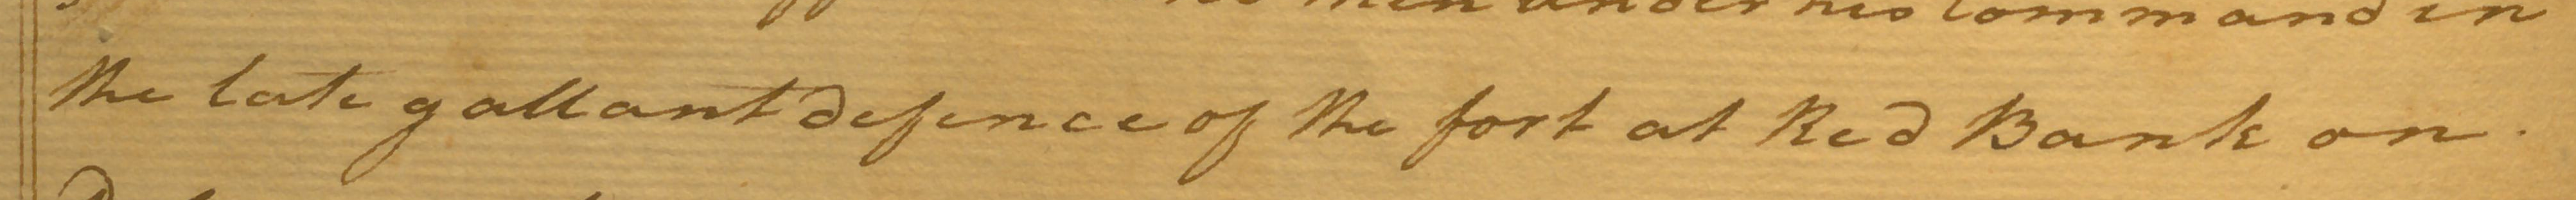the late gallant defence of the fort at Red Bank on
